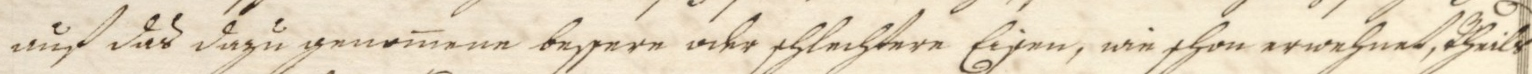auf das dazu genommene bessere oder schlechtere Eisen, wie schon erwehnet, Theils
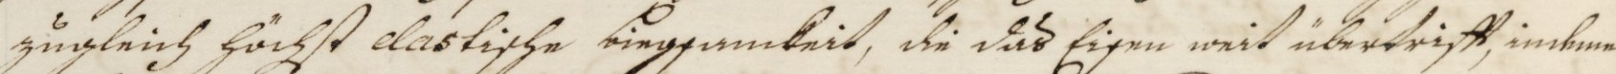zugleich höchst elastische Biegsamkeit, die das Eisen weit übertrifft, indeme
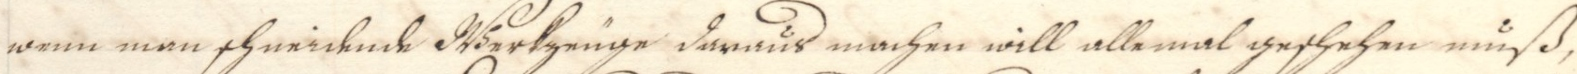wenn man schneidende Werkzeüge daraus machen will allemal geschehen muß,
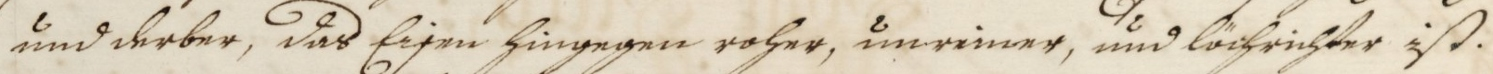und derber, das Eisen hingegen roher, unreiner, und löchrichter ist.
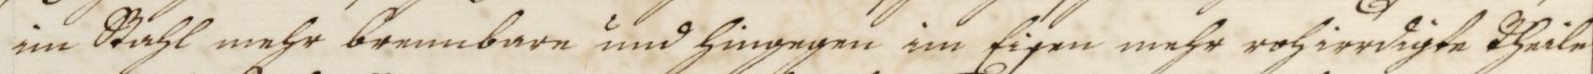im Stahl mehr brennbare und hingegen im Eisen mehr rohwirrdigte Theile
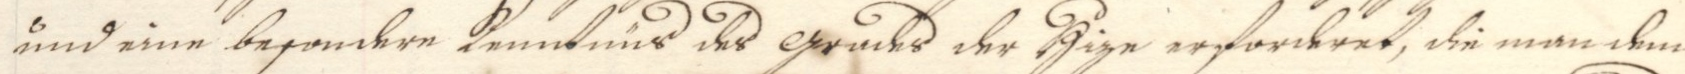und eine besondere Kenntnüs des Grades der Hize erforderet, die man dem
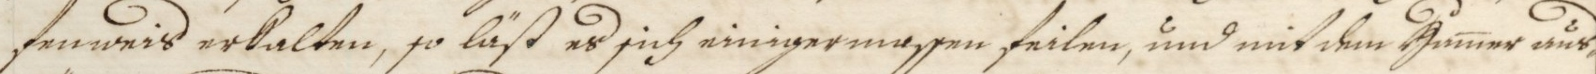fenweis erkalten, so läst es sich einigermassen feilen, und mit dem Hammer aus-
